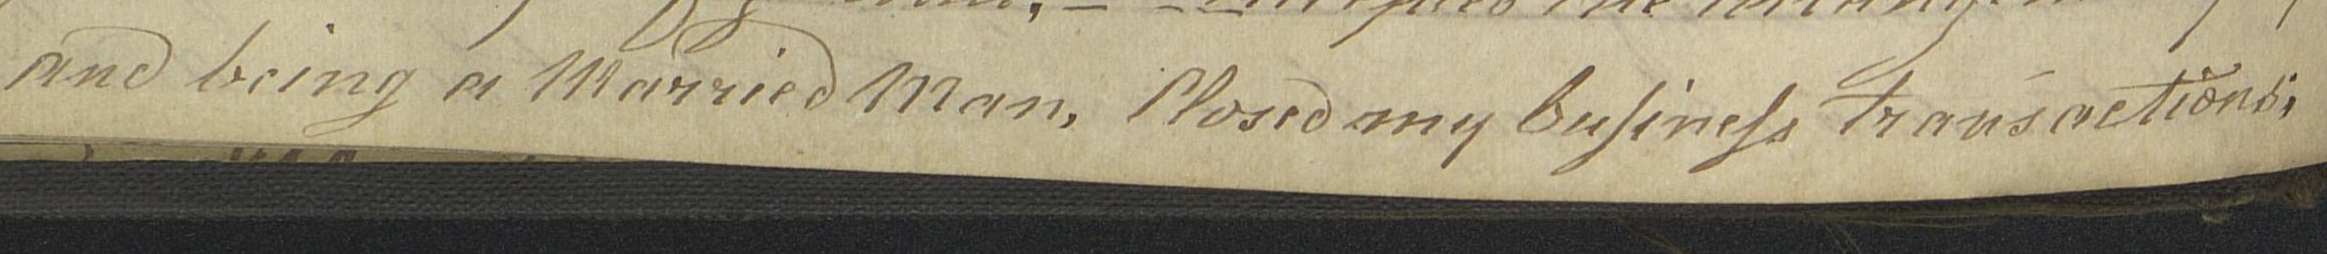and being a Married Man, Closed my business transactions;
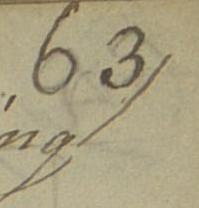63
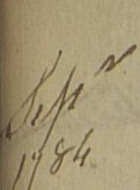Sep^r
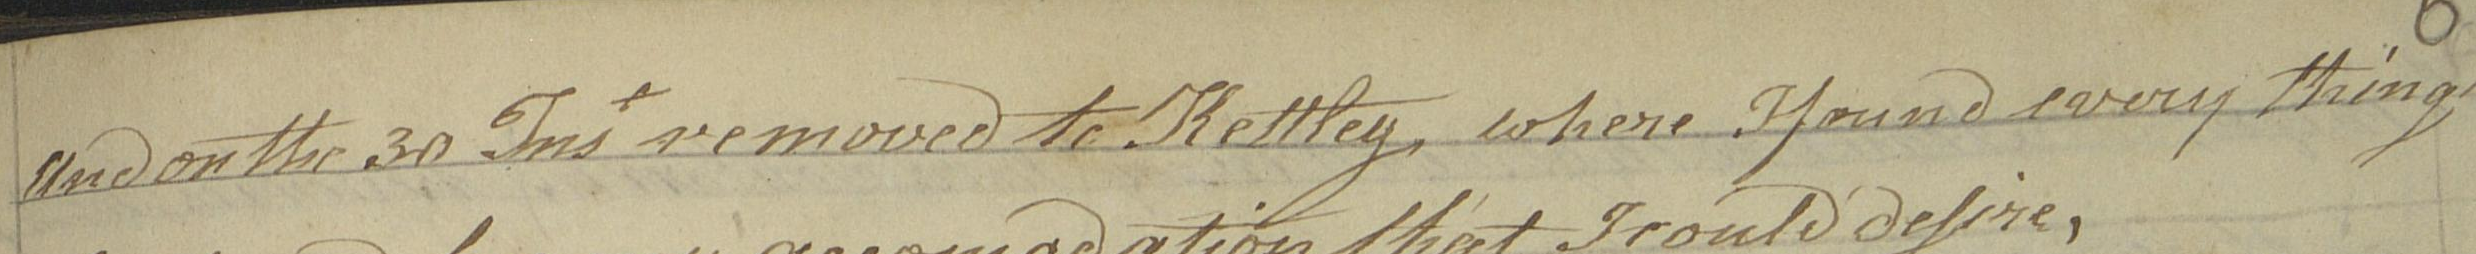under the 30 Ins^t removed to Kettley, where I found every thing
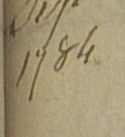1784
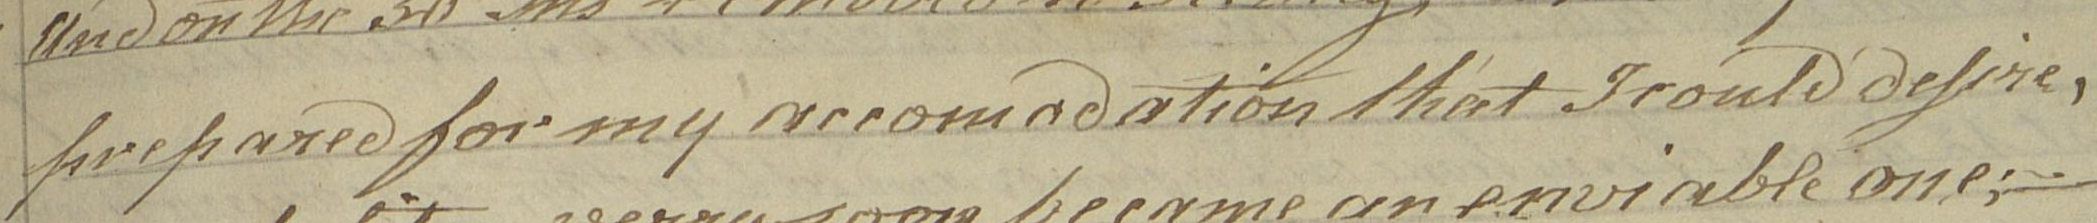prepared for my accomodation that I could desire,
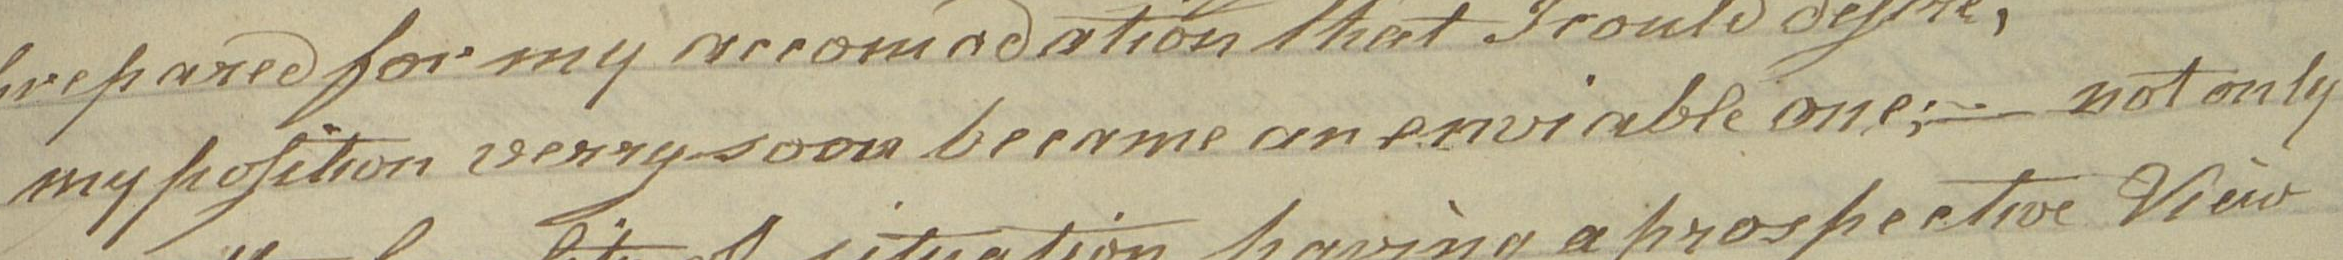my position verry soon became an enviable one; not only
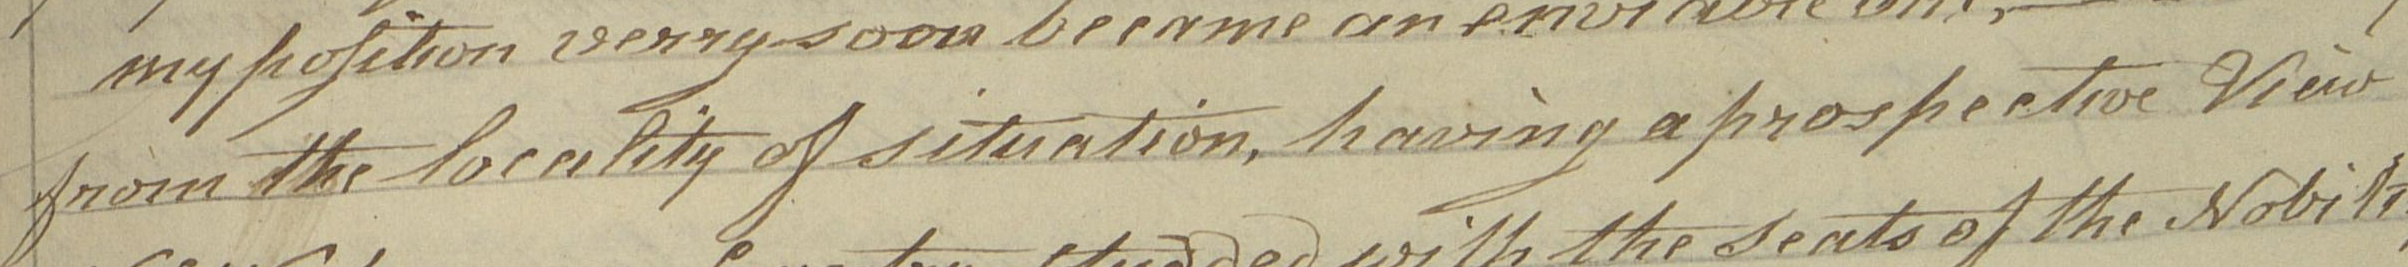from the locality of situation, having a prospective View
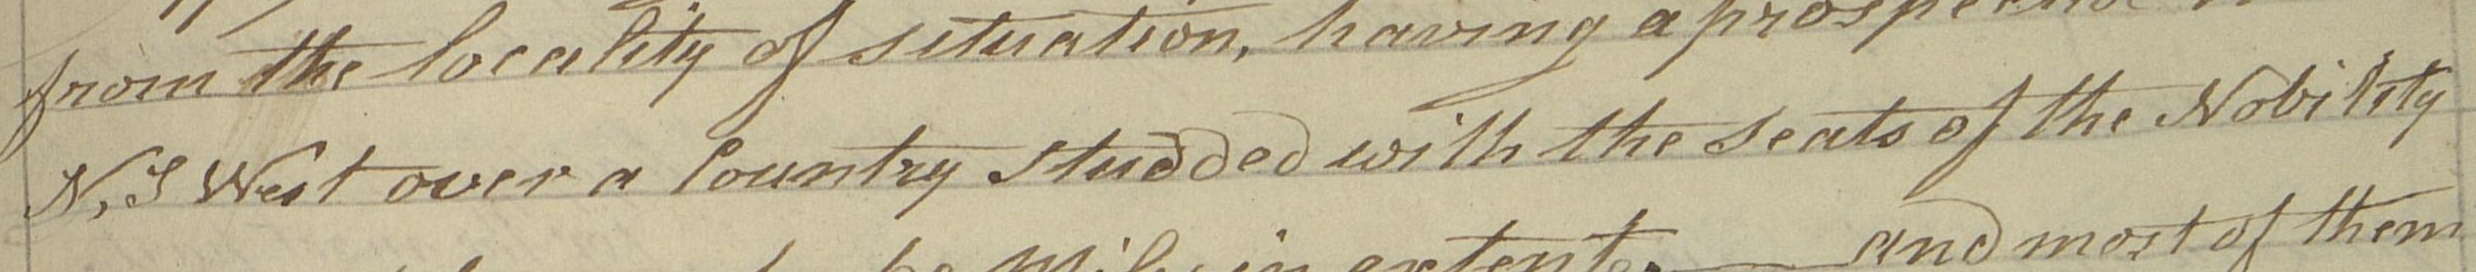N.S West over a Country studded with the seats of the Nobility
